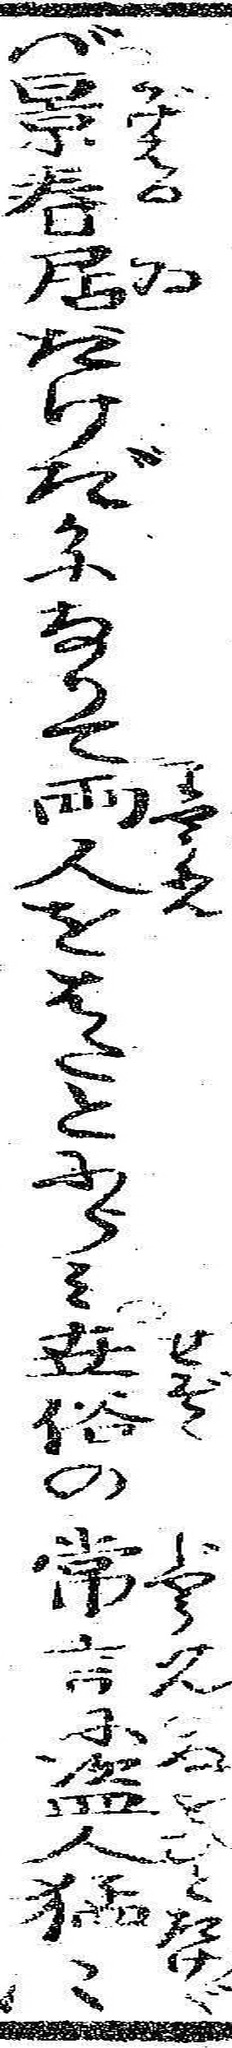ば。景春居たけだかになりて両人をはたとにらみ。世俗の常言に盗人猛々
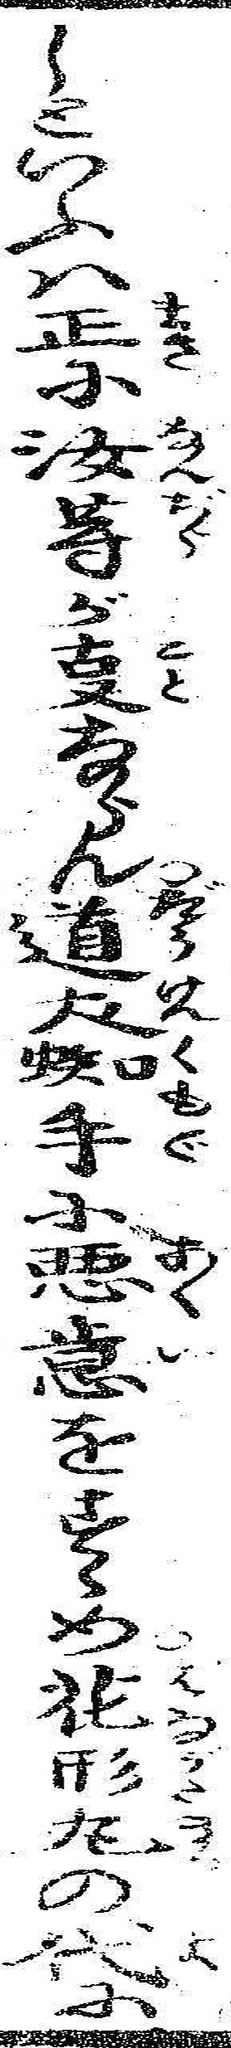しといふは正に汝等が事ならん。道犬蜘手に悪意をすゝめ。花形丸の代に
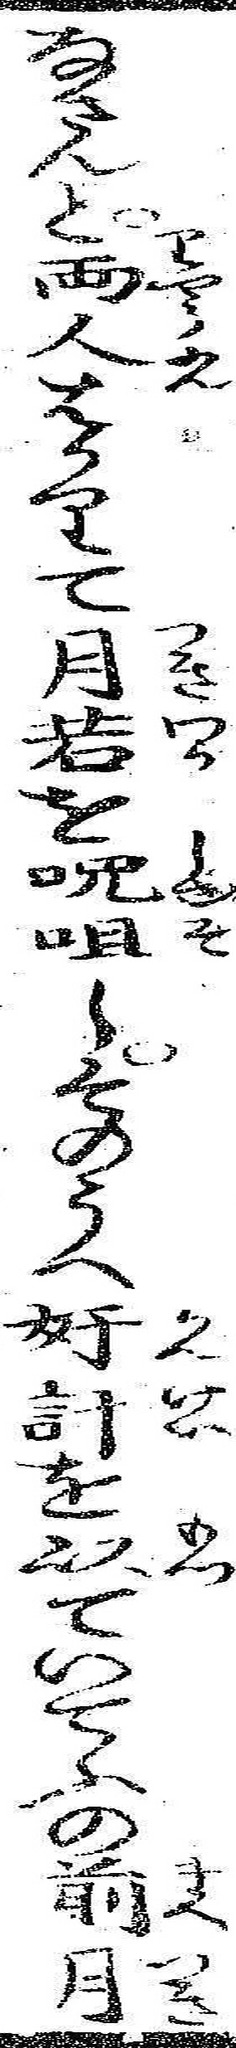なさんと。両人はかりて月若を呪咀し。そのうへ奸計を以ていてふの前月
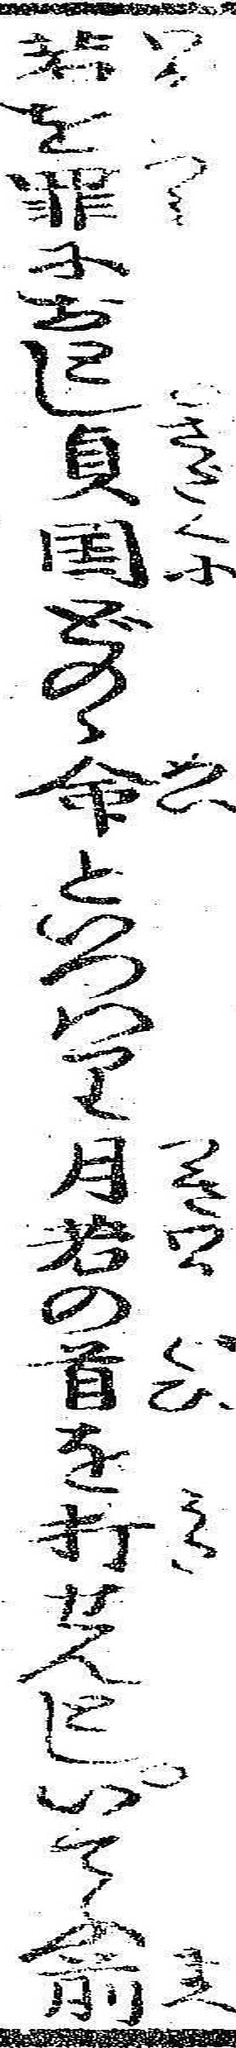若を罪におとし。貞国どのゝ命といつはり月若の首を打せんとし。いてふ前
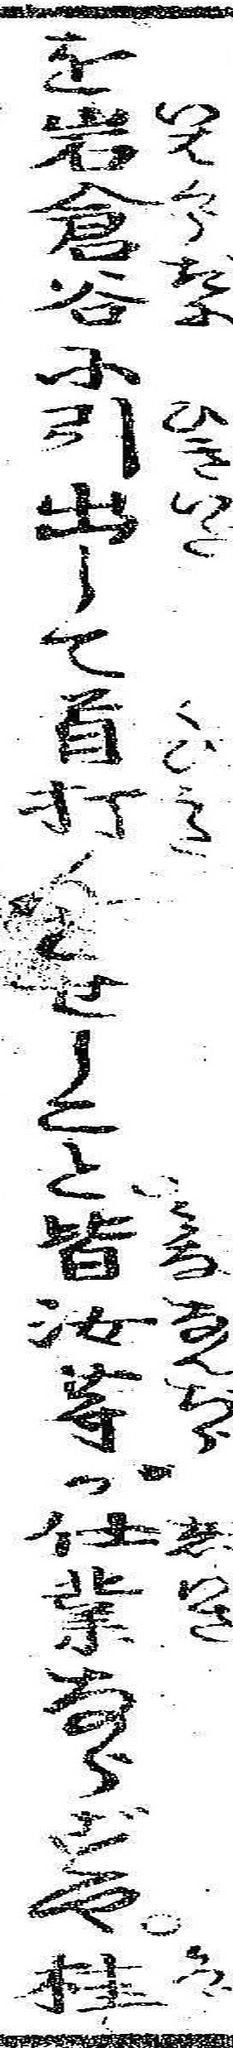を岩倉谷に引出して首打んとせしこと。皆汝等が仕業ならずや。桂
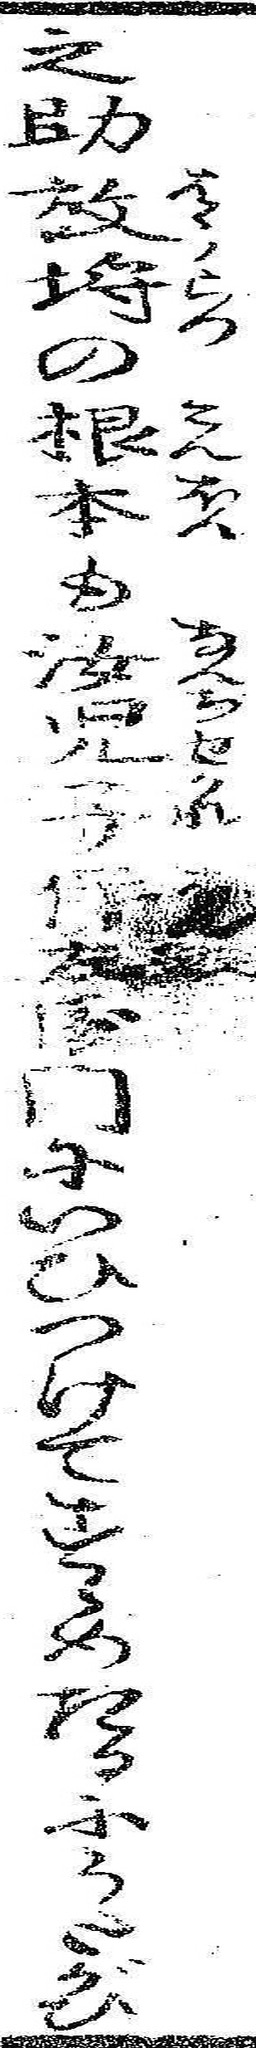之助放埓の根本も汝児子伴左衛門にいひつけてすゝめたるにうたがひ
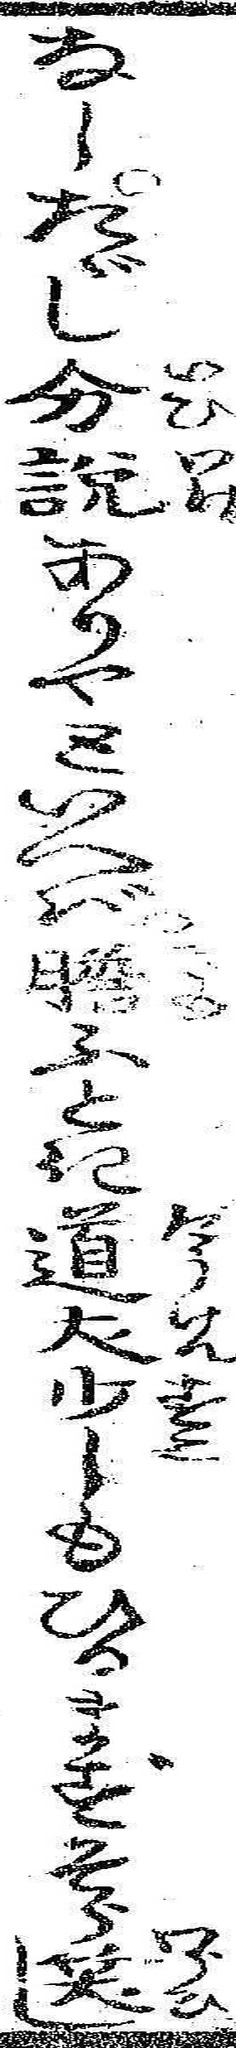なし。たゞし分説ありやといへば。胆ふとき道犬少しもひるまずそら笑し
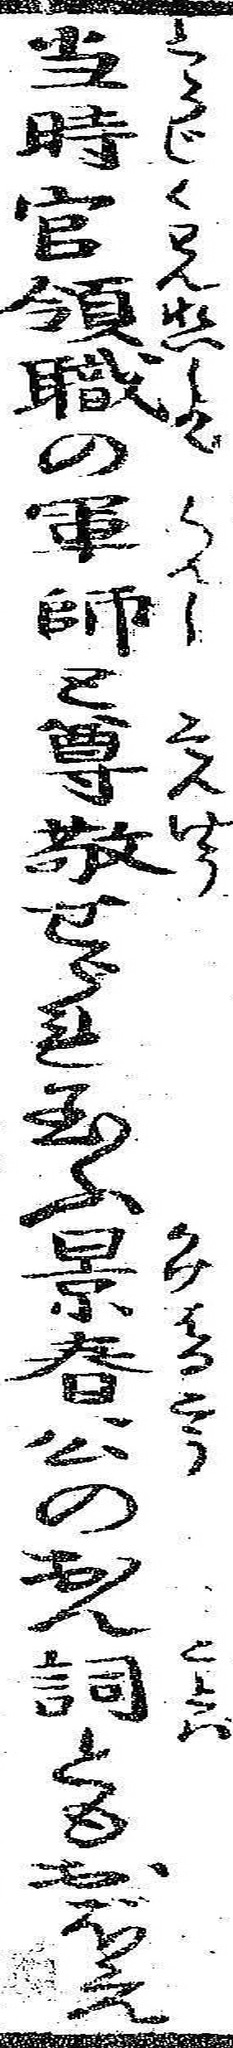当時官領職の軍師と尊敬せられ玉ふ景春公のおん詞ともおぼえ
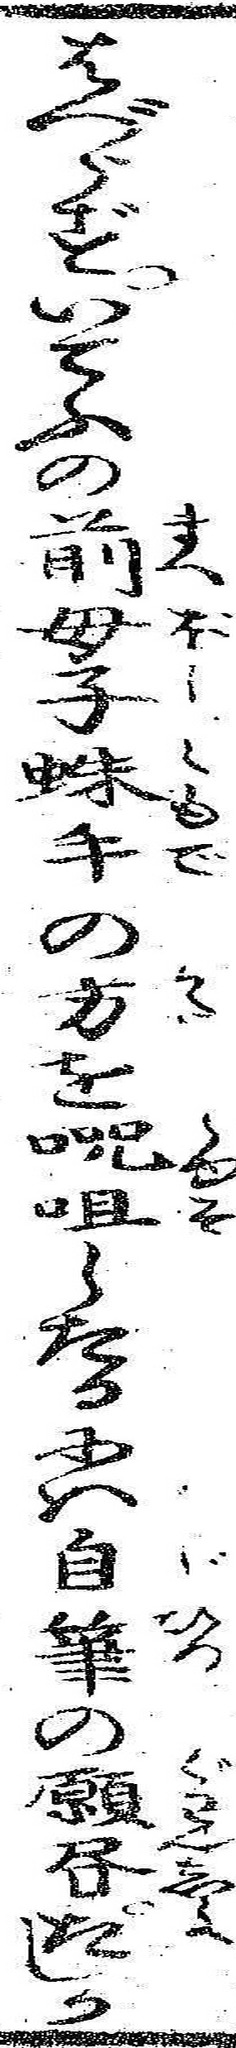はべらず。いてふの前母子蛛手の方を呪咀したるには自筆の願書。たしか
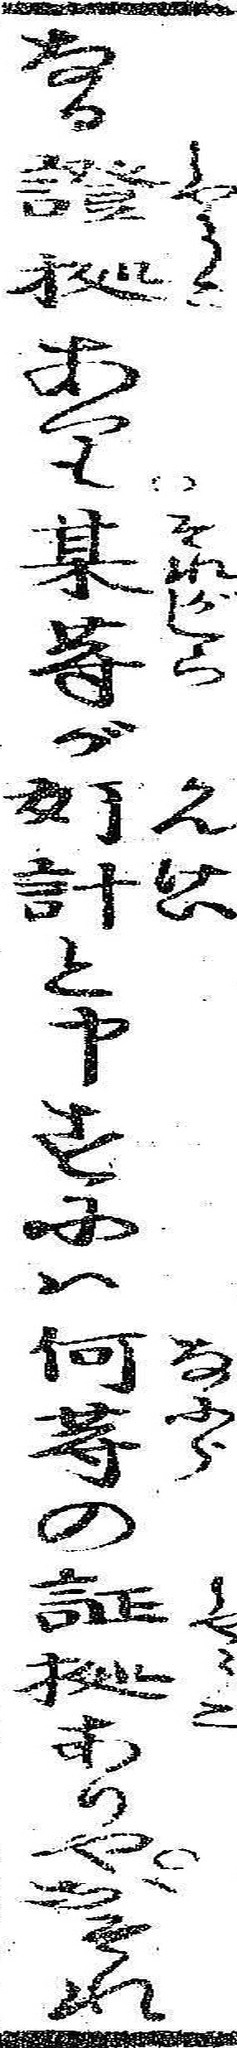なる証拠あり。某等が奸計と申すには何等の証拠ありや。おそれ

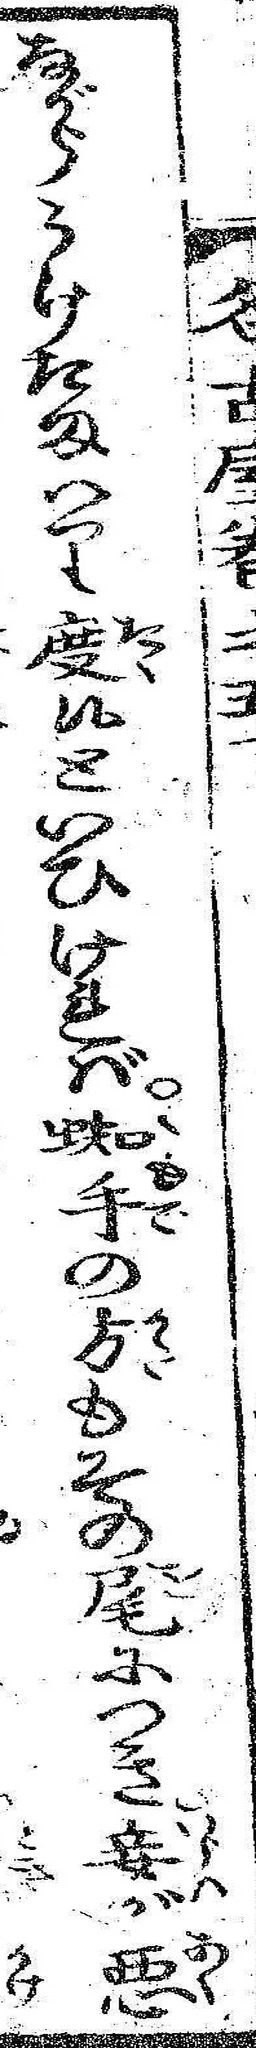ながらうけたまはり度候といひければ。蜘手の方もその尾につき。妾が悪
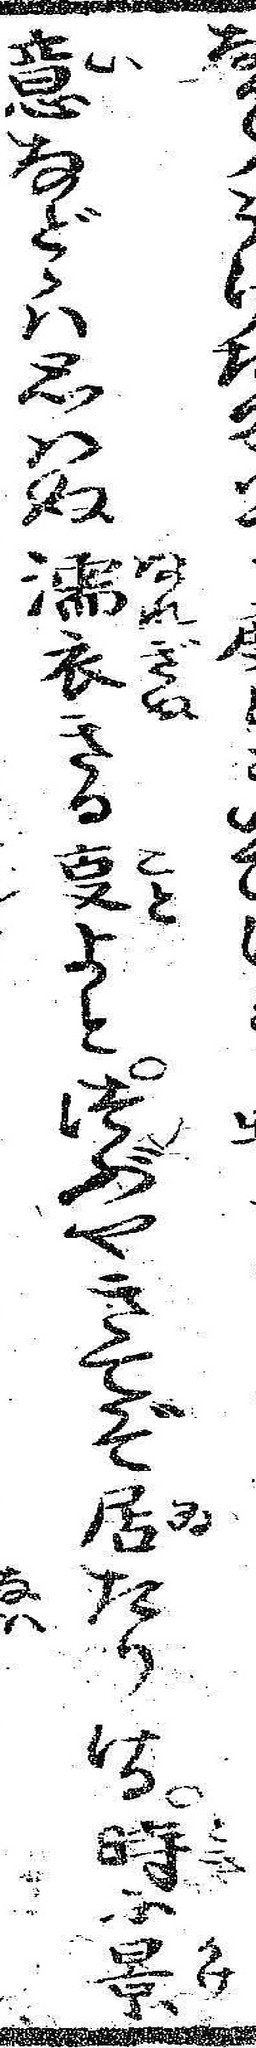意などゝは思はぬ濡衣きる事よと。つぶやきてぞ居たりける。時に景
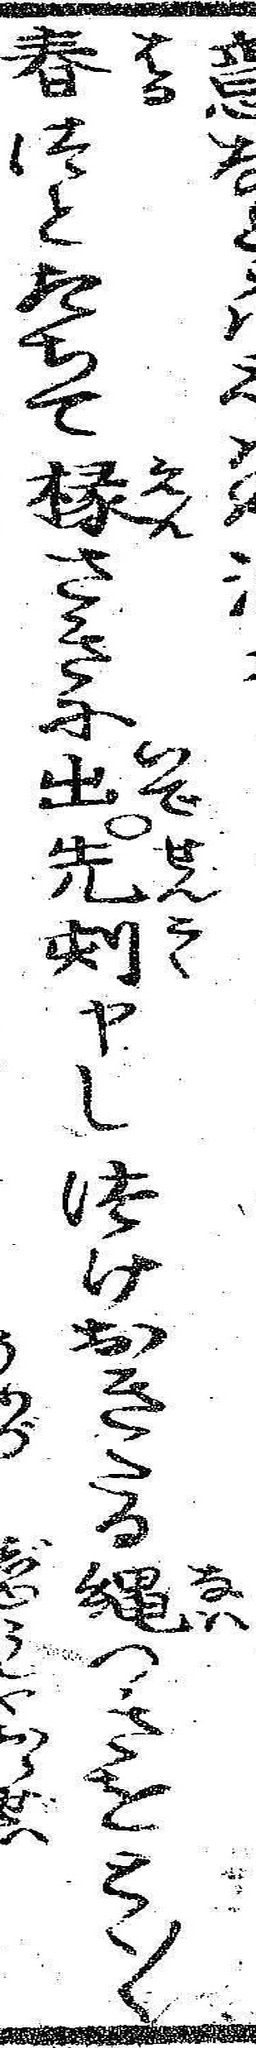春つとたちて椽さきに出。先刻申しつけおきたる縄つきをとく〳〵
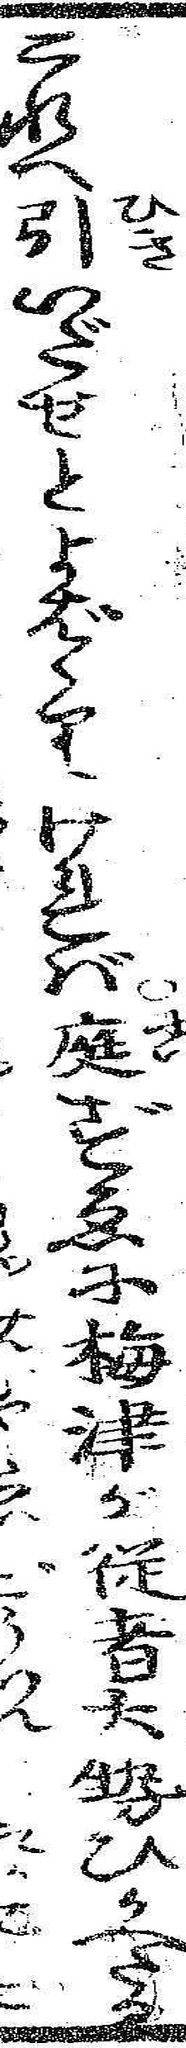これへ引いだせとよばゝりければ。庭ずゑに梅津が従者大勢ひかへたる
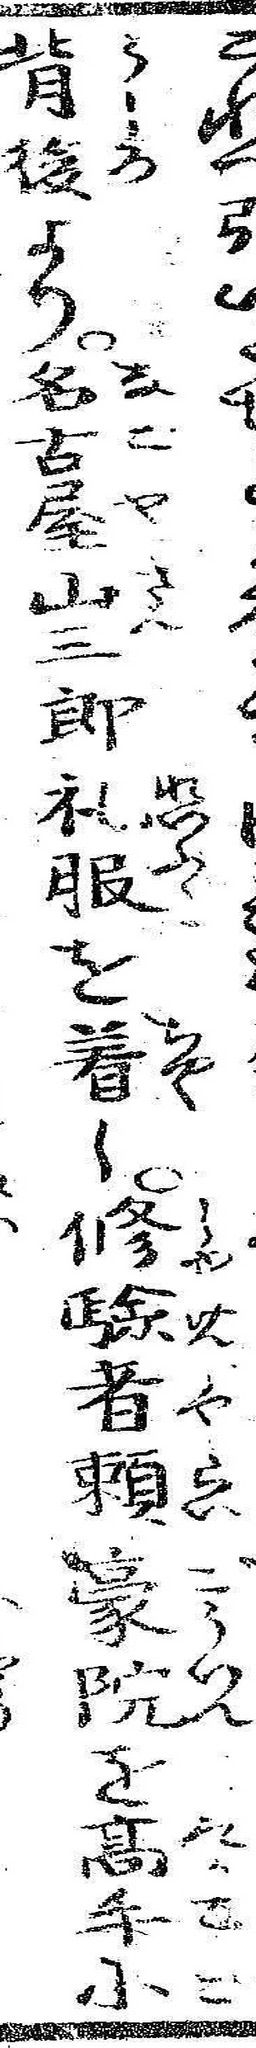背後より。名古屋山三郎礼服を着し。修験者頼豪院を高手小
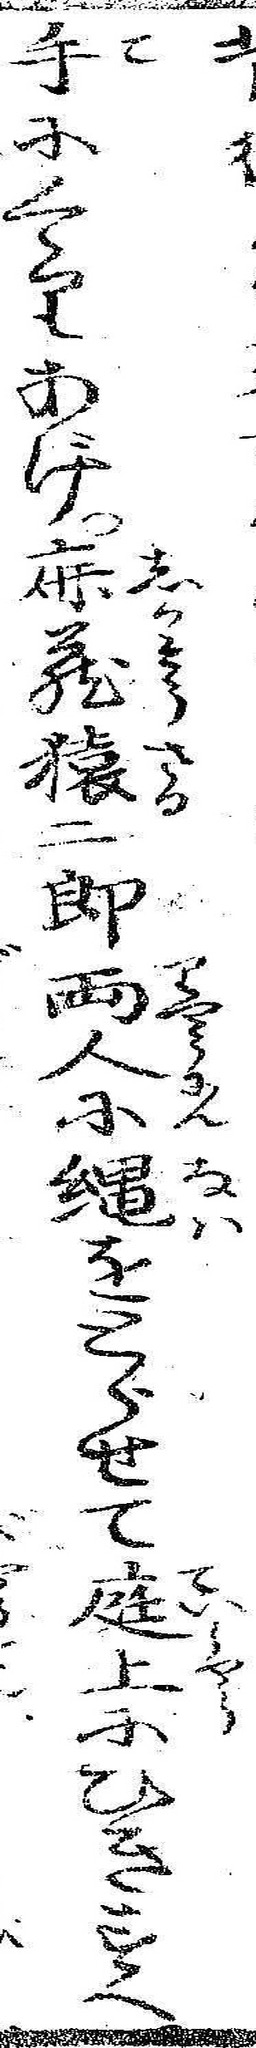手にくゝりあげ。鹿蔵猿二郎両人に縄をとらせて庭上にひきすへ
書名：昔話稲妻表紙
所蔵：国文学研究資料館
